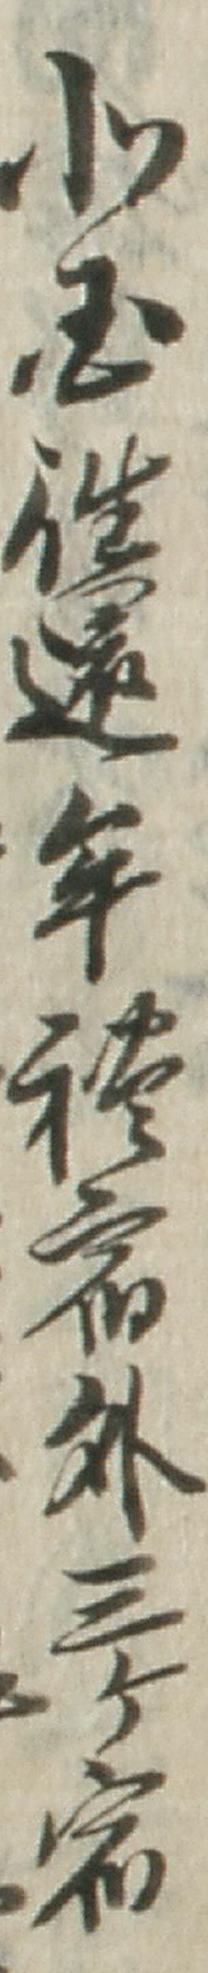北国往還牟礼宿外三ヶ宿
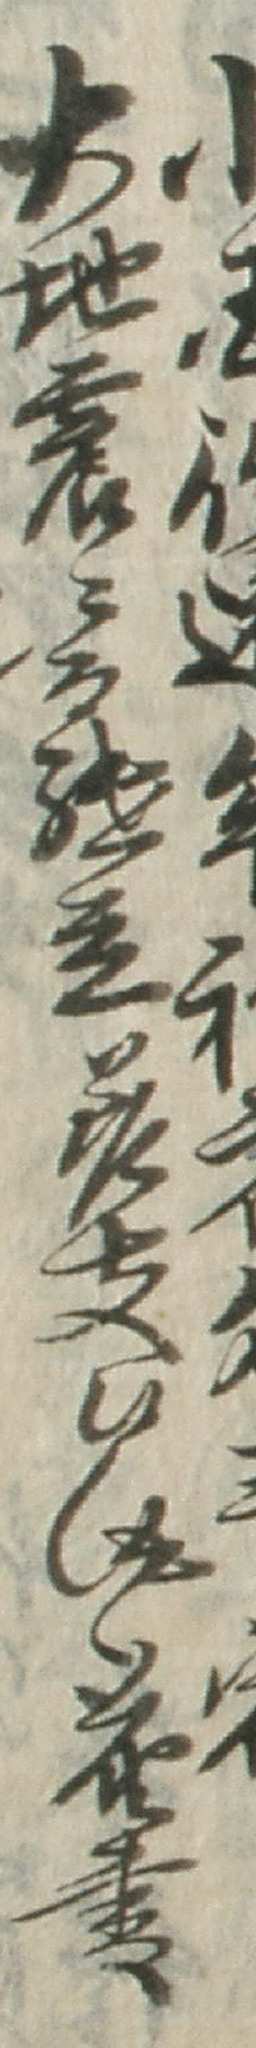大地震二而継立差支候趣御届書
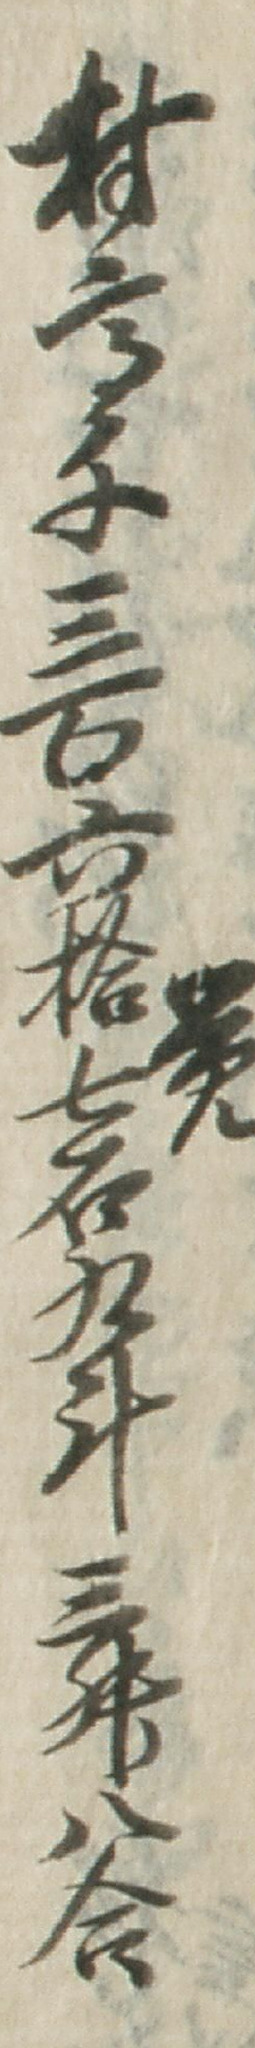村高千三百六拾七石九斗三升八合

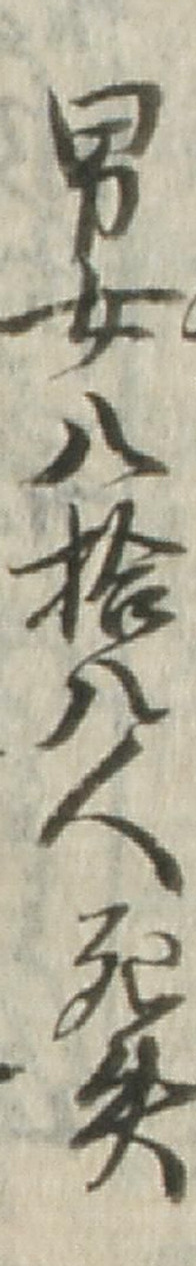男女八拾八人死失
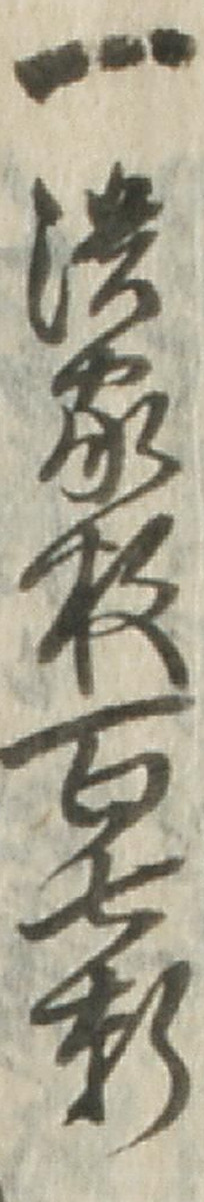一潰家数百七軒
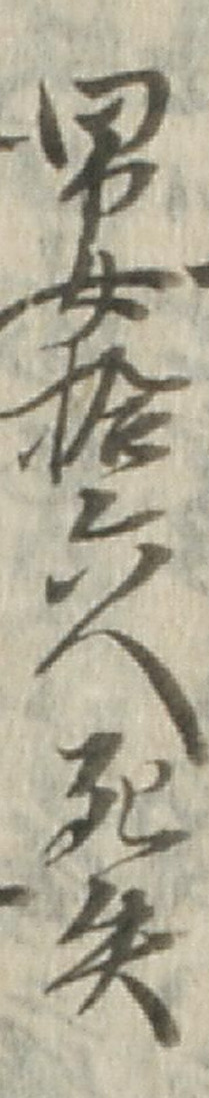内男女拾六人死失
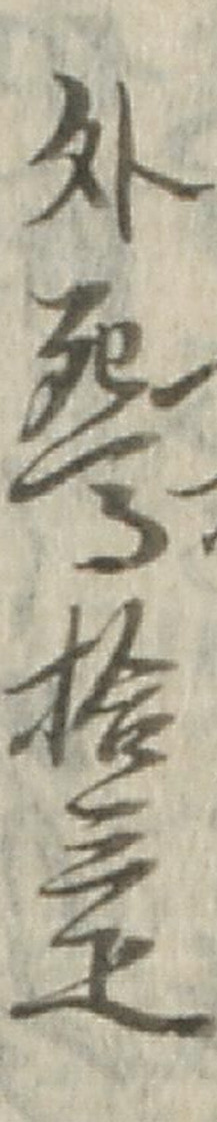外死馬拾三疋
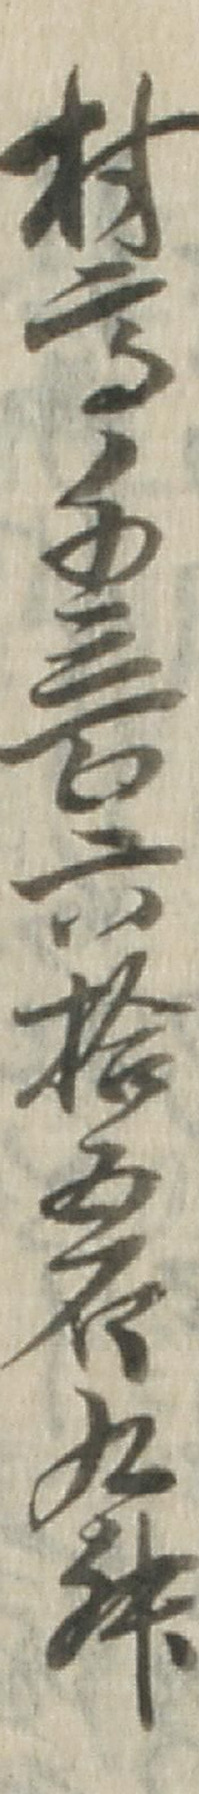村高千三百六拾五石九升右同断
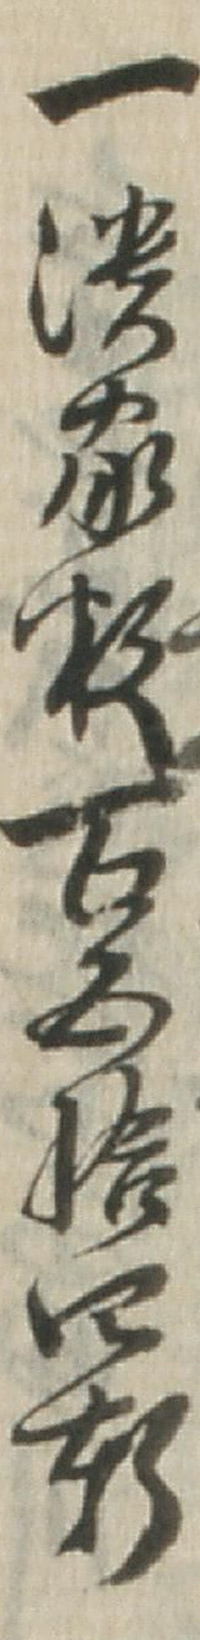一潰家数百五拾四軒
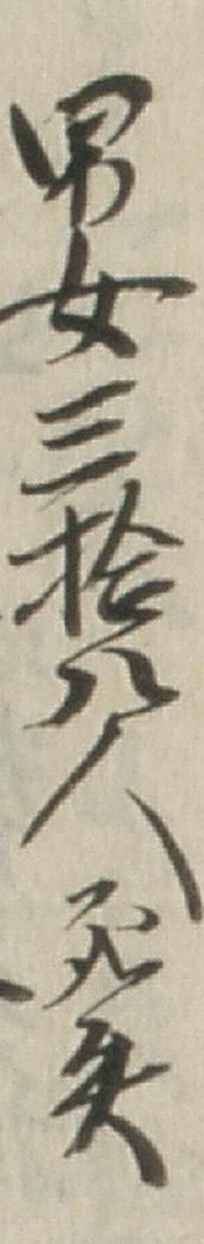男女三拾八人死失
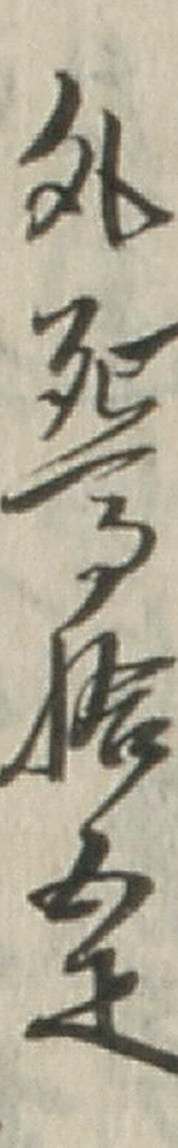外死馬拾三疋
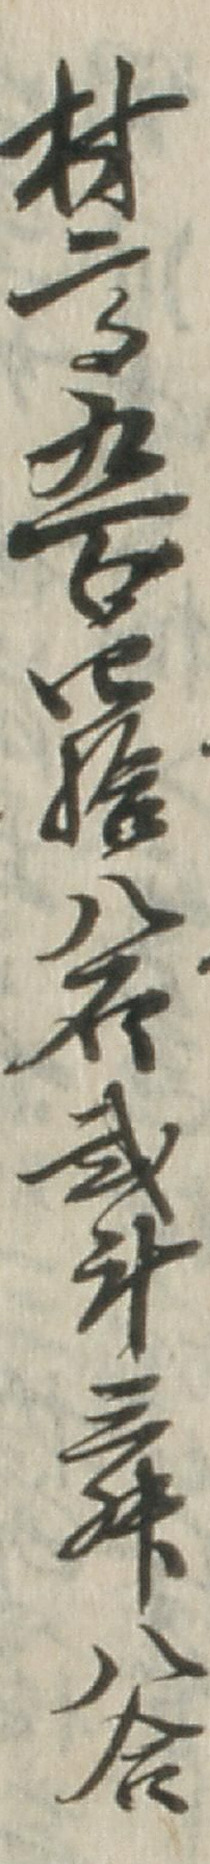村高九百四拾八石弐斗三升八合右同断
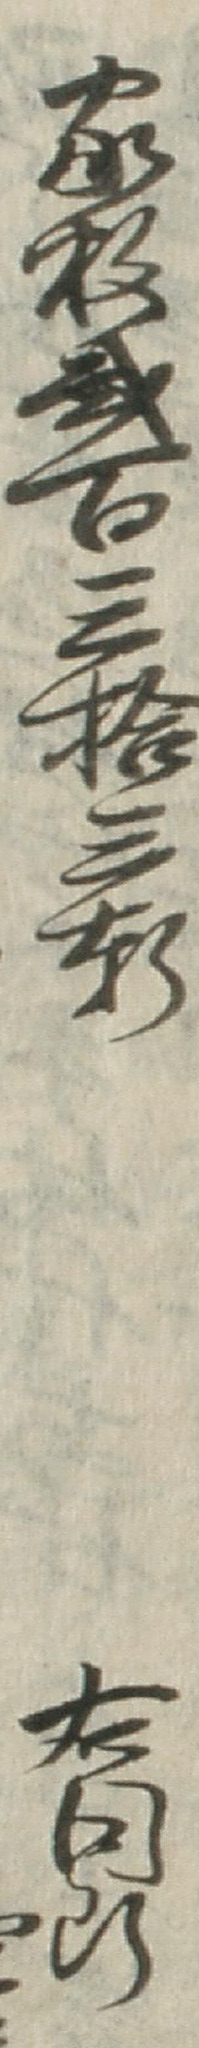家数弐百三拾三軒野尻宿
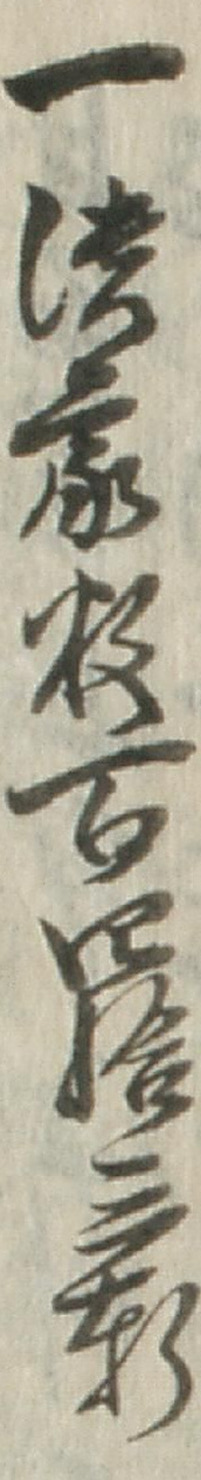一潰家家数百四拾三軒
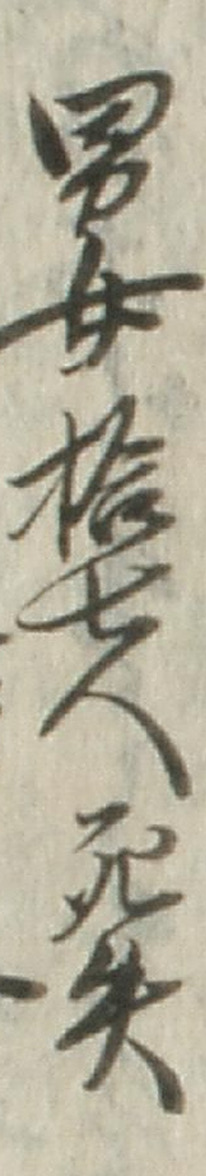男女拾七人死失
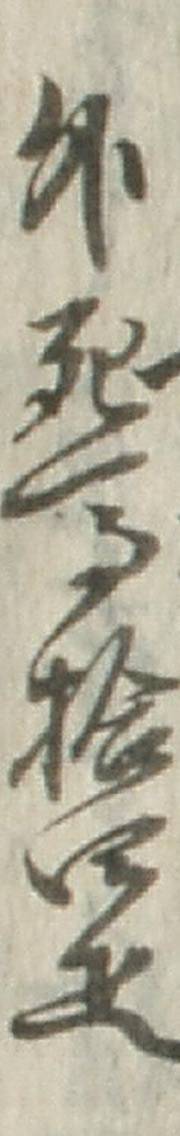外死馬拾四疋
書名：信濃國地震實録記
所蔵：東京大学地震研究所図書室 Earthquake Research Institute Library, The University of Tokyo, JAPAN
